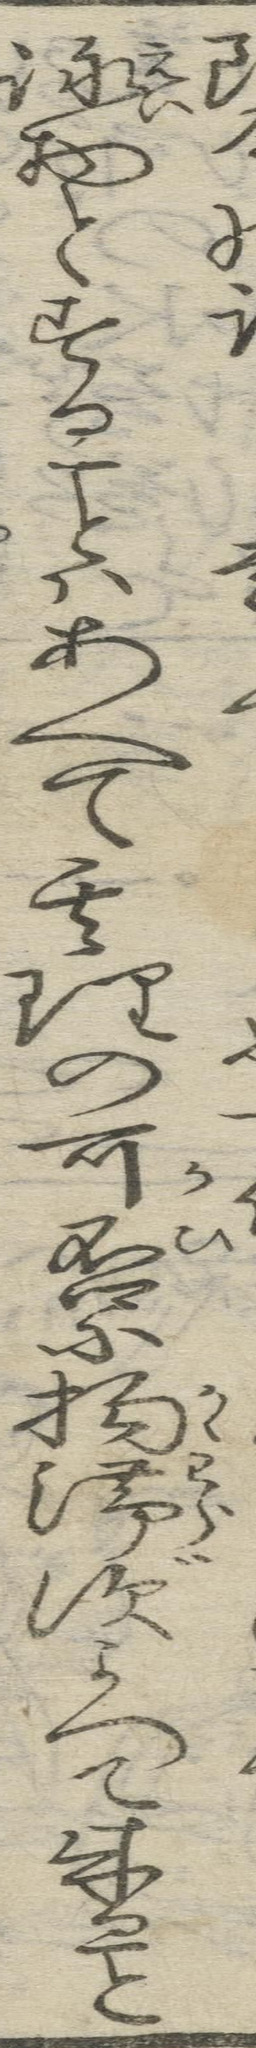詠物とすることはあへて其理の可否に拘滞ずよつて来ること
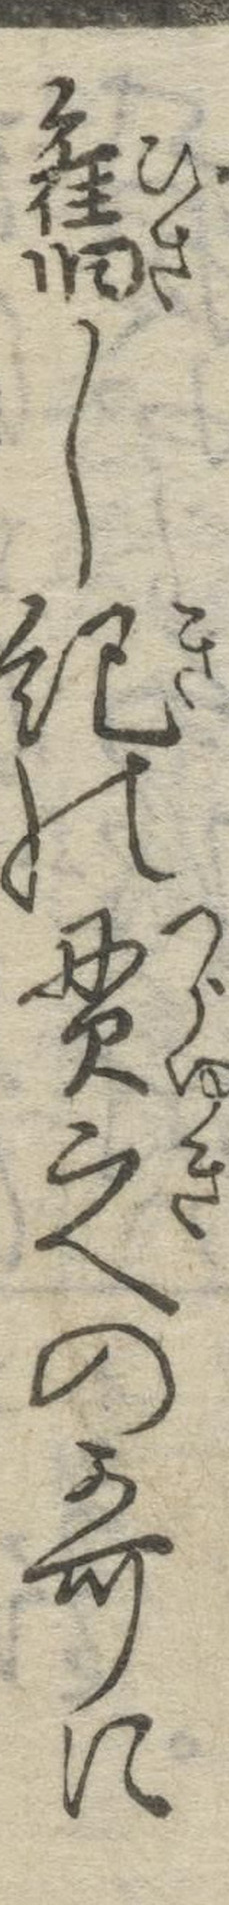旧し紀の貫之の歌に
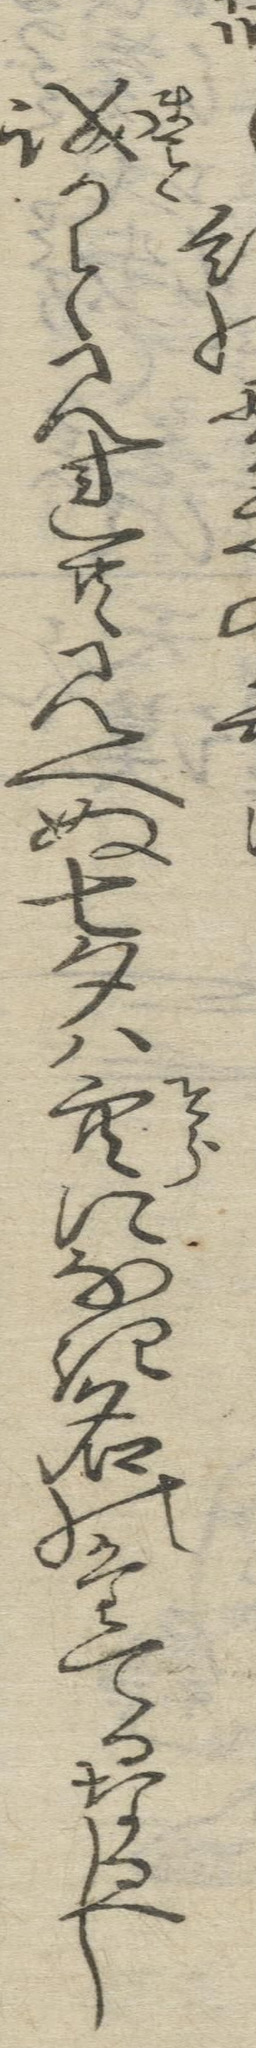誠かと見れ共見へぬ七夕は空になき名のたてるなるへし
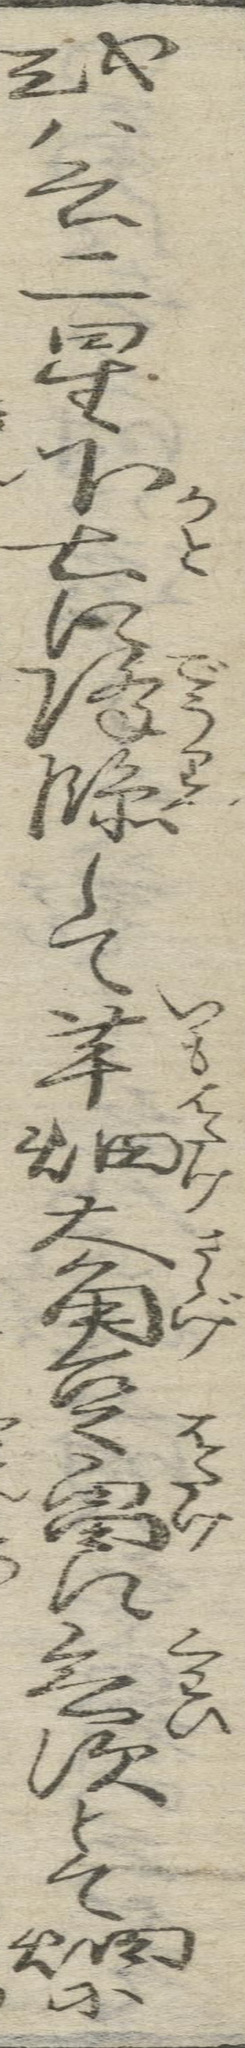或は云二星下土に降臨して芋畑大角豆畠に会すとて畑に
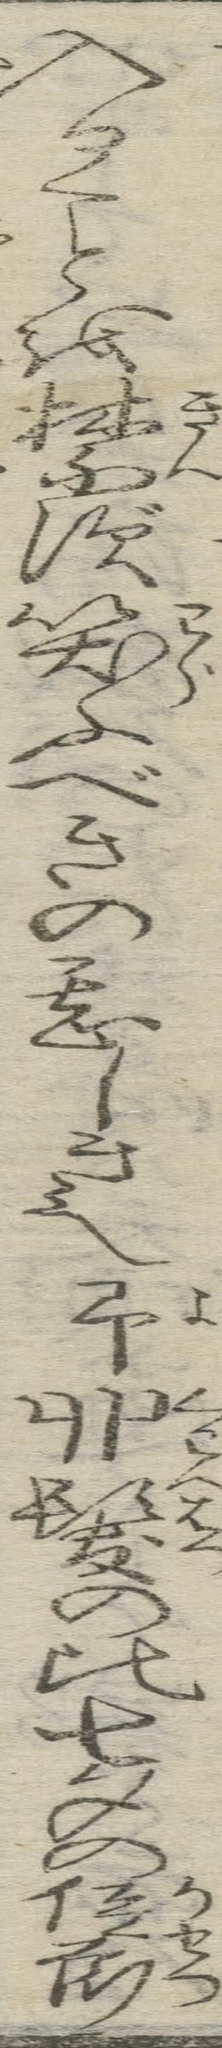入ることを禁ず笑ふべきの甚しき也予丱髪の比七夕の佳節
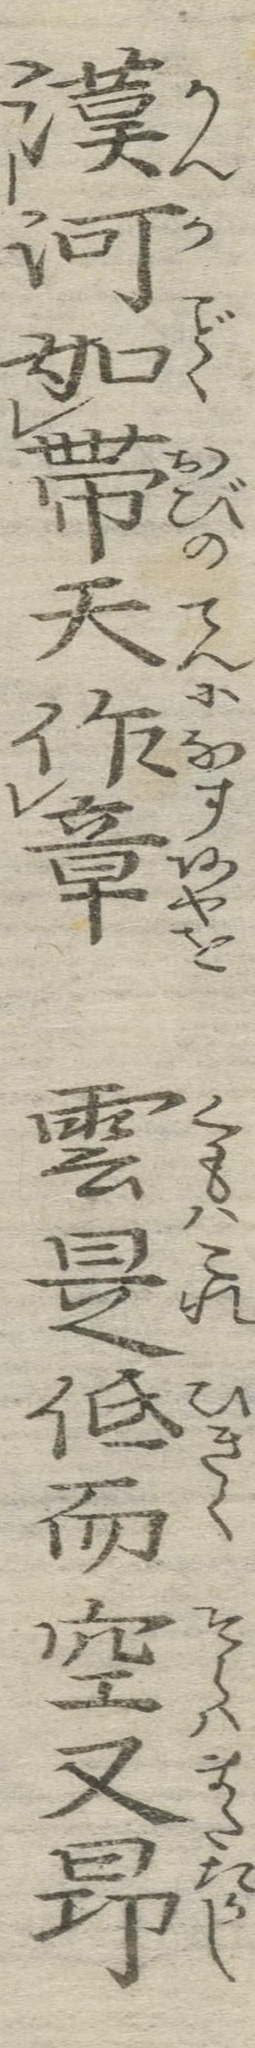漢河如帯天作章雲是低而空又昂
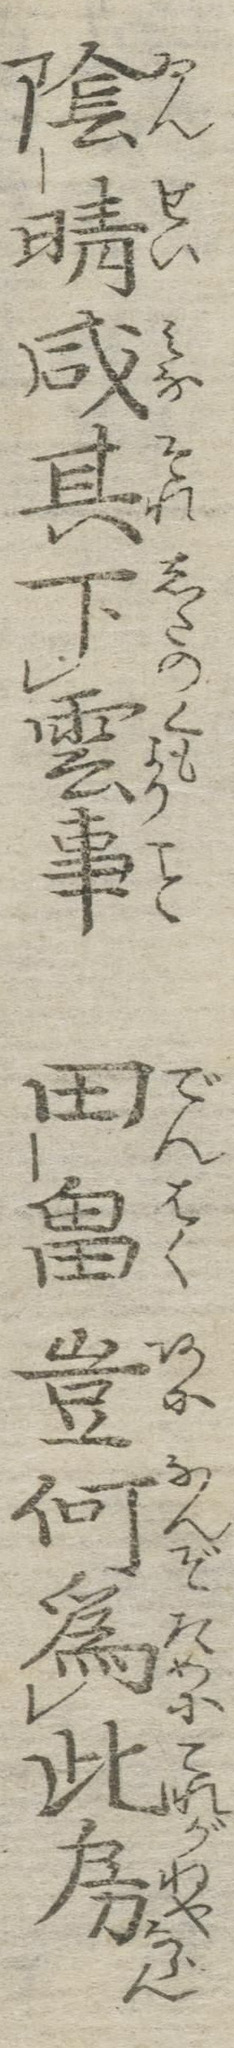陰晴咸其下雲事田畠豈何為此房
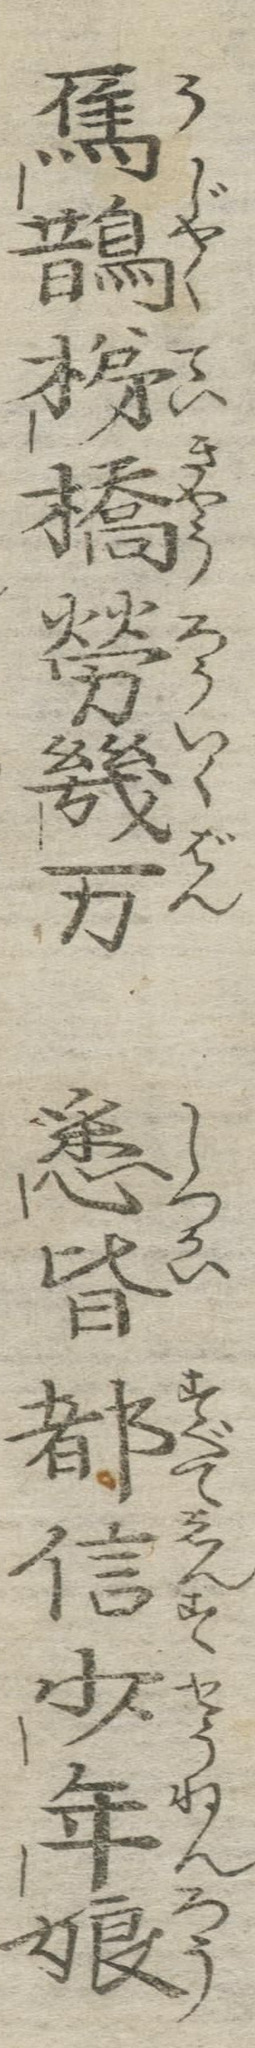烏鵲梯橋労幾万悉皆都信少年娘
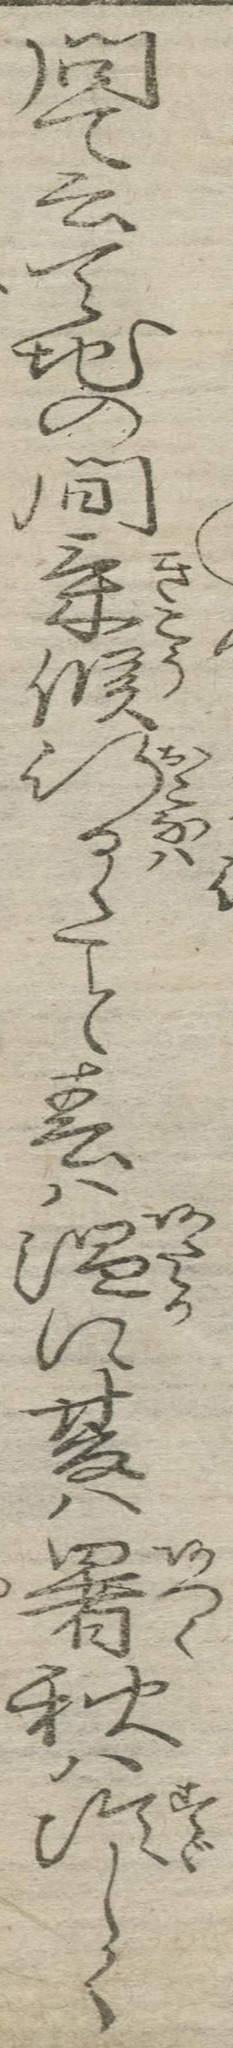問て云天地の間気候行ること春は温に夏は暑秋は涼しく
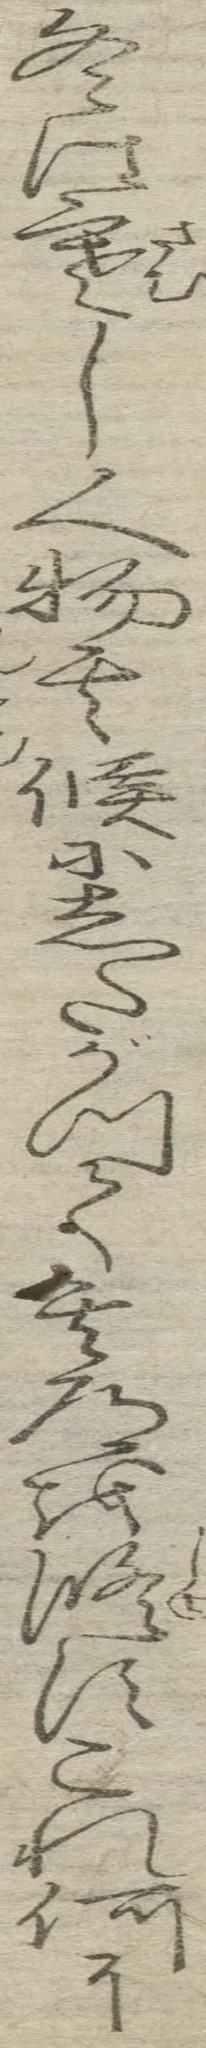冬は寒し人物其候にしたがつて其道を修すこれ何に
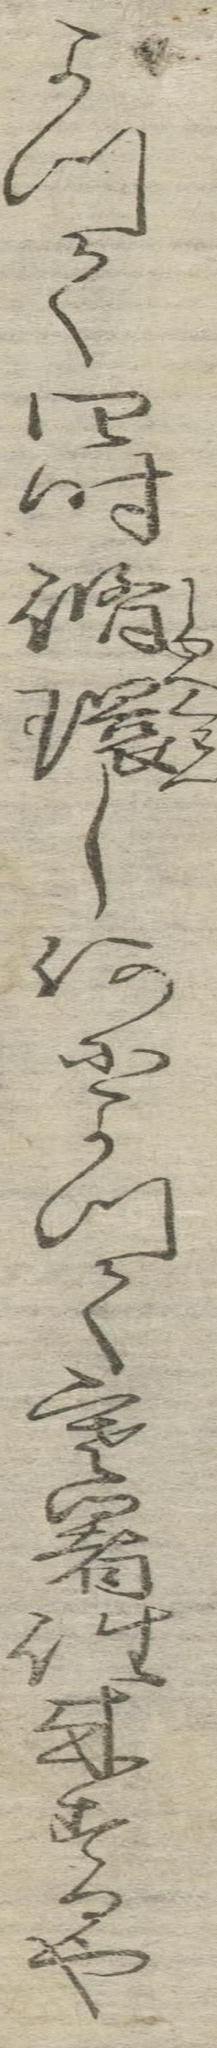よつて四時循環し何によつて寒暑往来するや

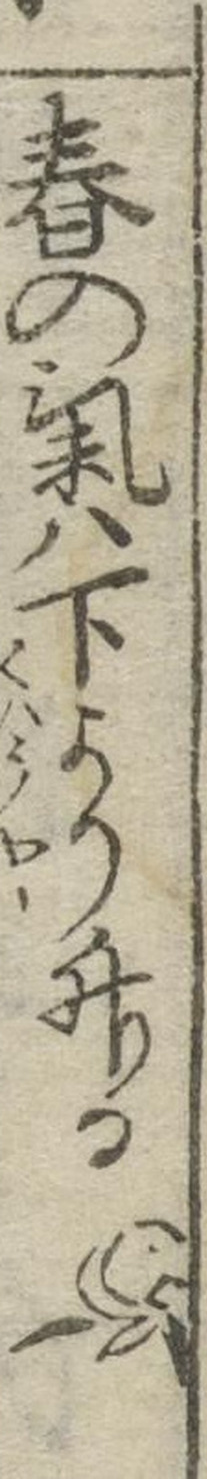春の気は下より升る
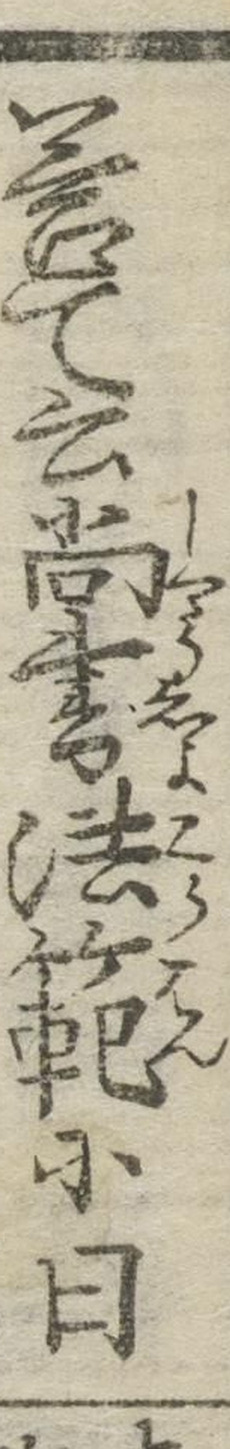答て云尚書洪範に日
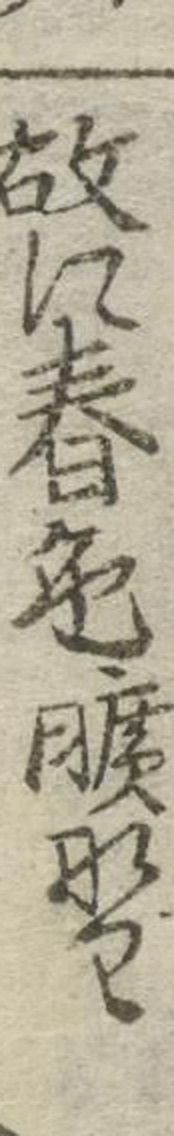故に春色曠野
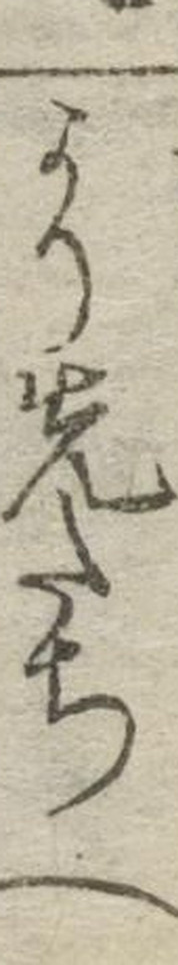より先たち
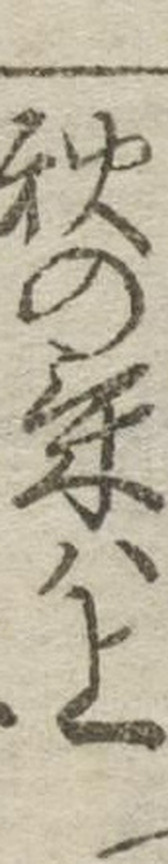秋の気は上
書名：訓蒙天地辨　天
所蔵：東京大学地震研究所図書室 Earthquake Research Institute Library, The University of Tokyo, JAPAN
